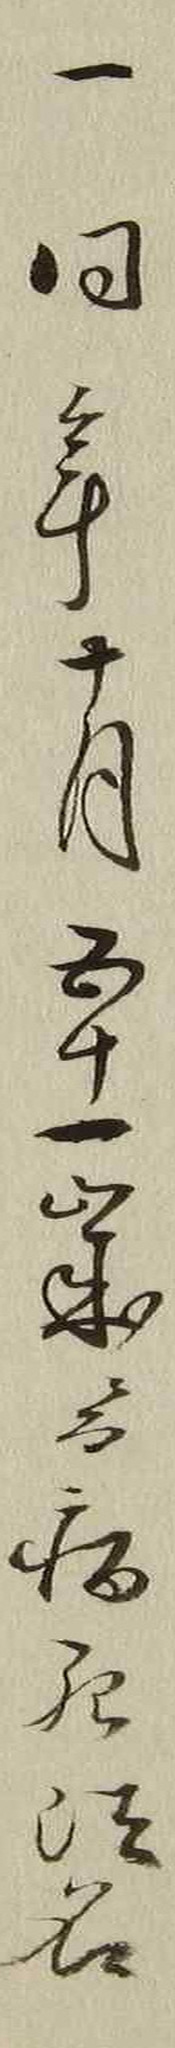一同年十月五十一歳ニ而病死法名
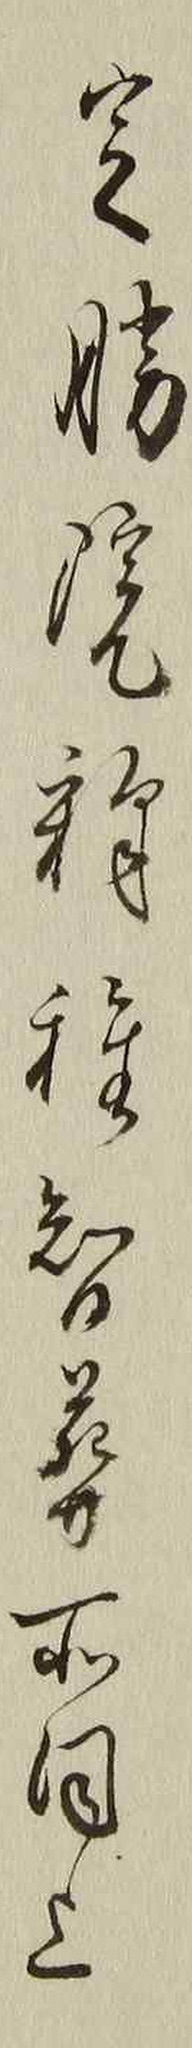定勝院釈種智葬所同上
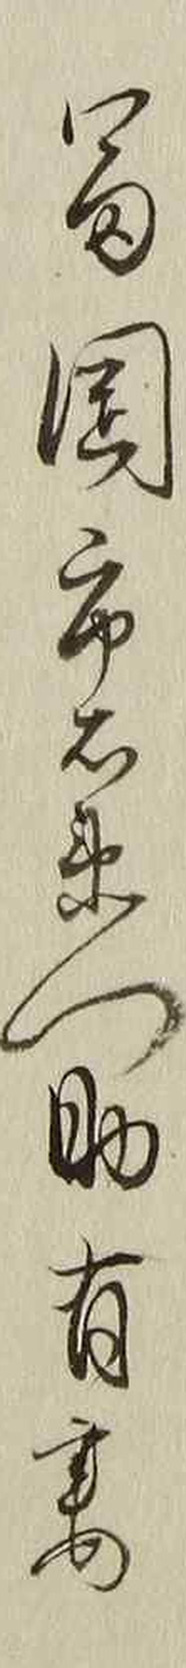女富岡市右衛門助有妻
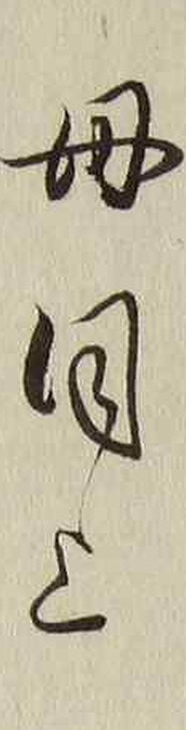母同上
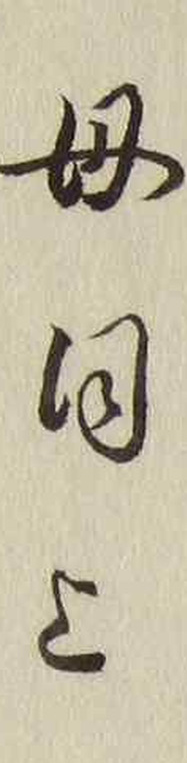母同上

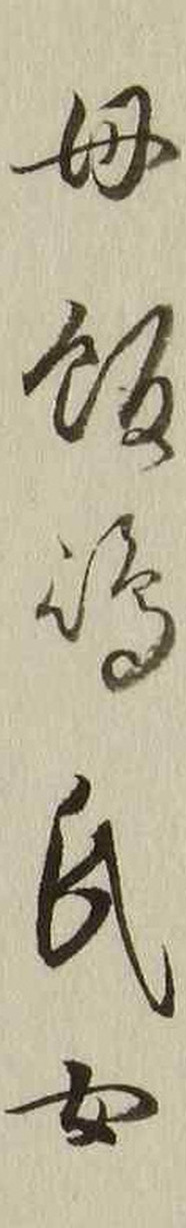母飯嶋氏女
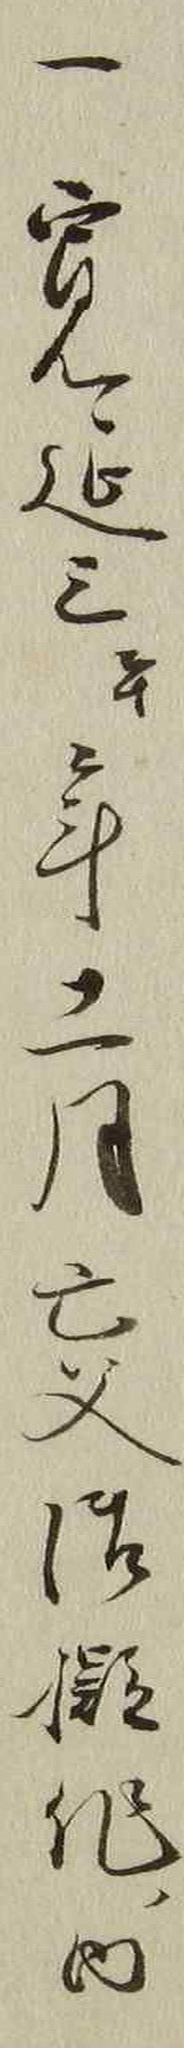一寛延三午年十一月亡父御擬作ノ内
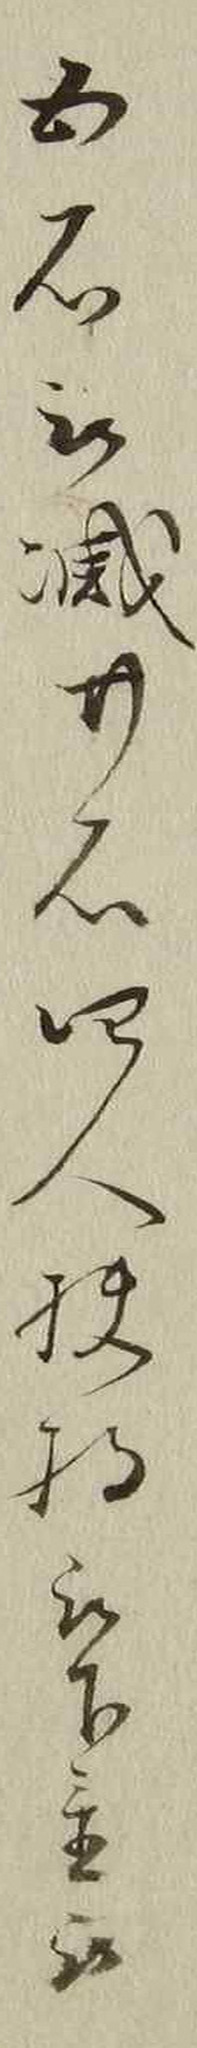五石被減廿石四人扶持被下置被
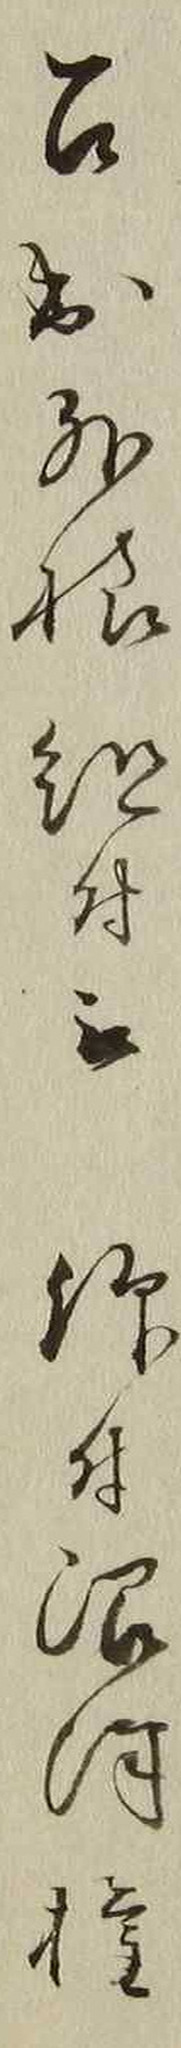召出外様組付被仰付沼澤権
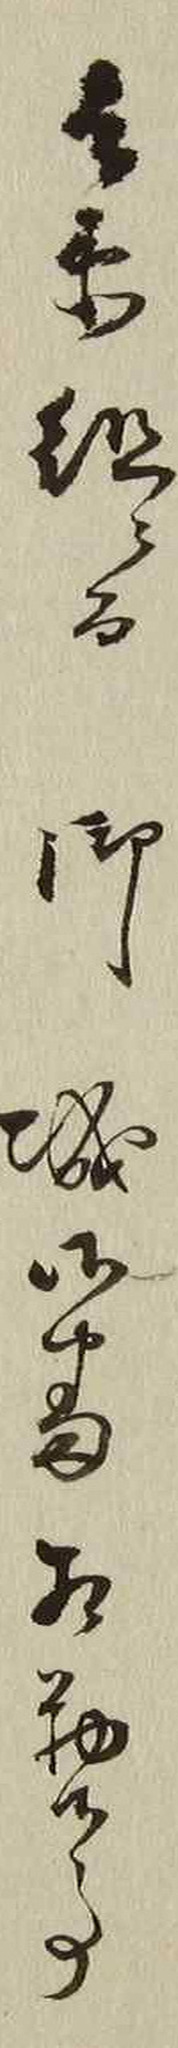兵衛組ニ而御城御番相勤候事
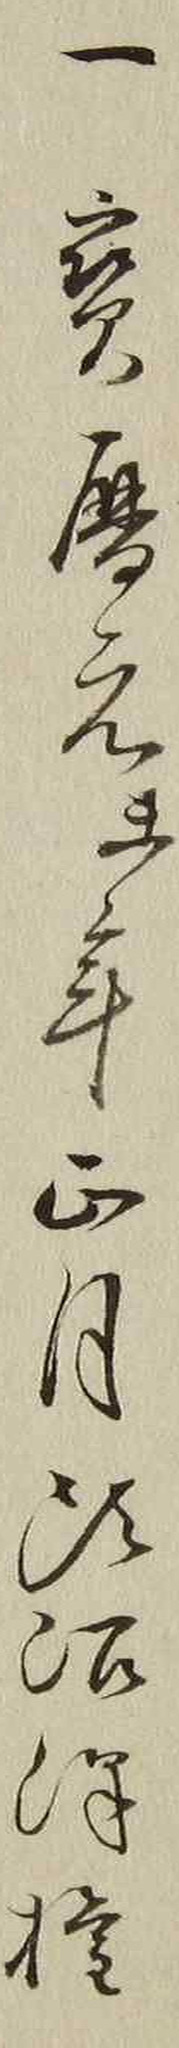一宝暦元未年正月頭沼澤権
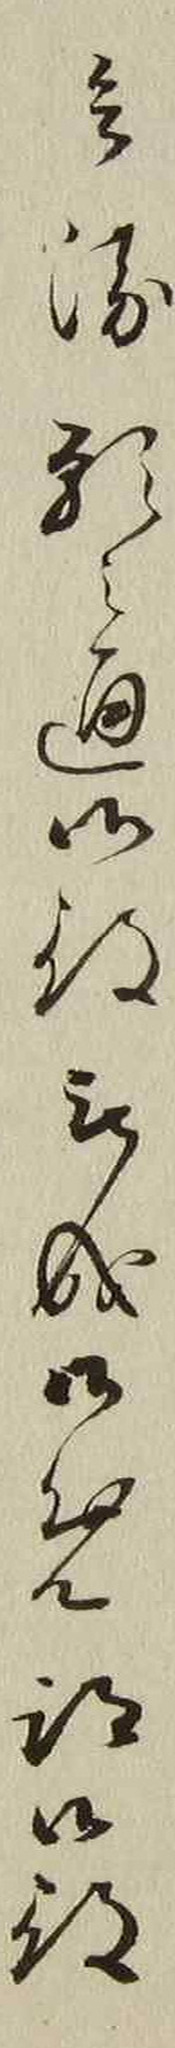兵衛願之通御役被成御免跡御役
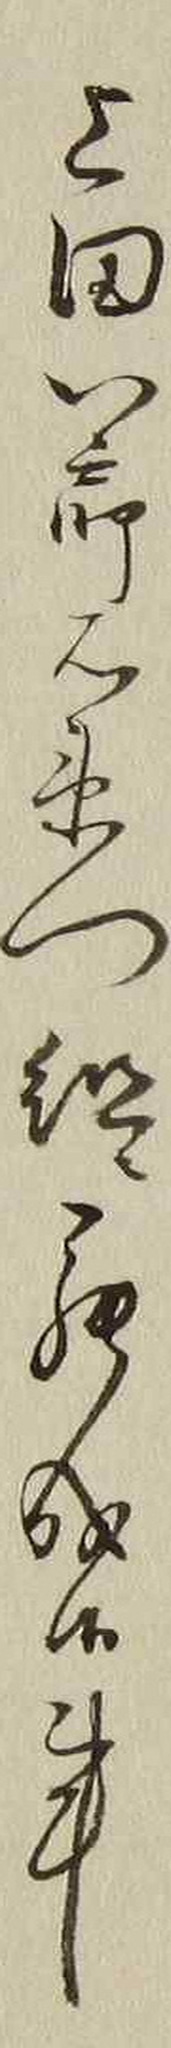上田八郎右衛門組ニ罷成候事
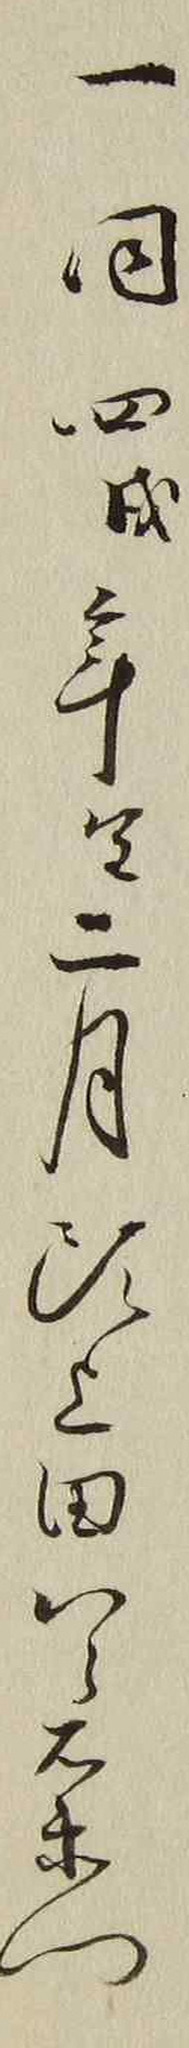一同四戌年閏二月頭上田八郎右衛門
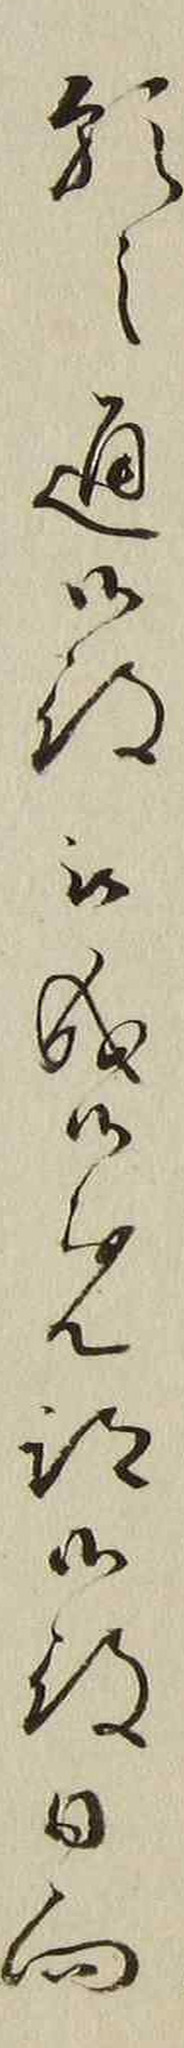願之通御役被成御免跡御役日向
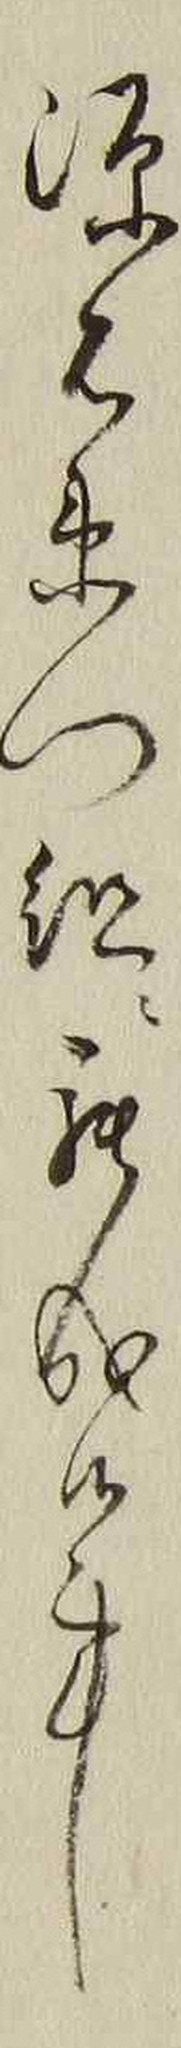源右衛門組ニ罷成候事
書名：諸士系譜　巻之129　た之部5
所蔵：会津若松市立会津図書館
